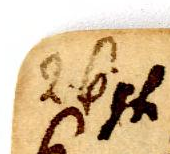26
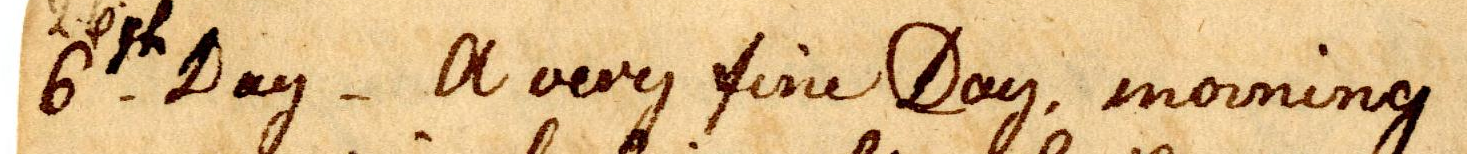6^th Day- A very fine Day, morning
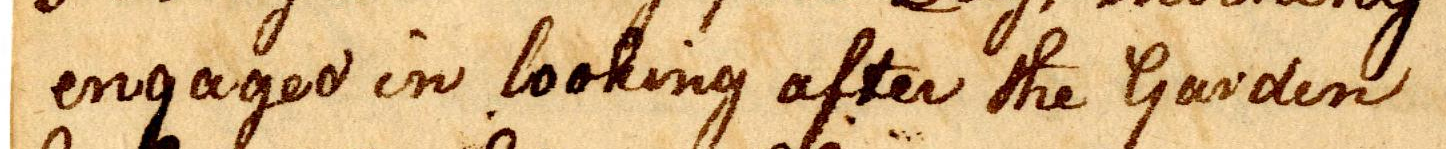engaged in looking after the Garden
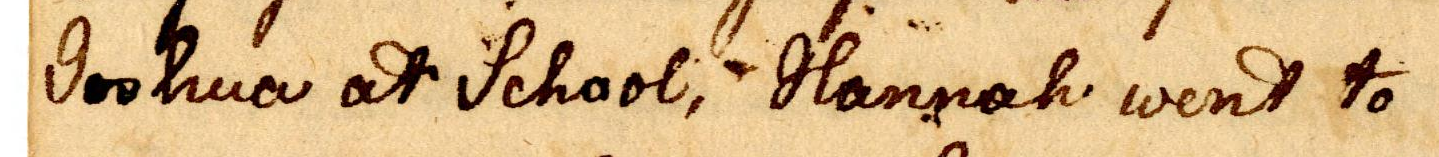Joshua at School, Hannah went to
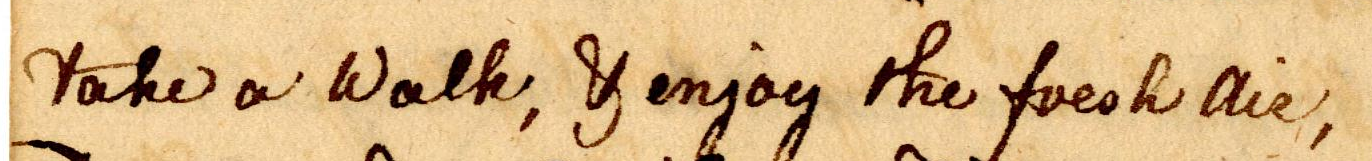take a Walk, & enjoy the fresh Air,
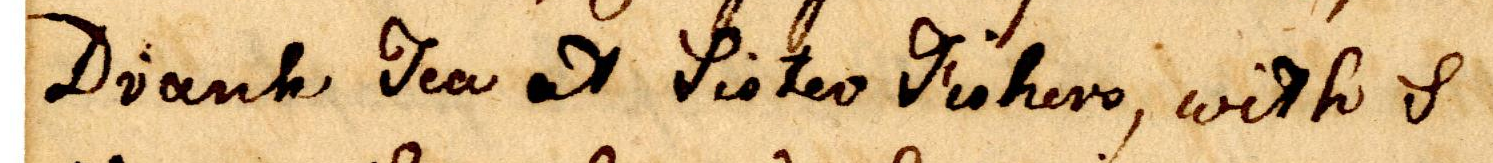Drank Tea at Sister Fishers, with S
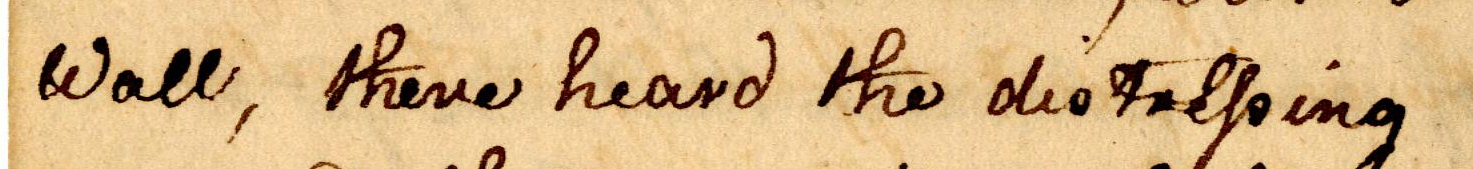Wall, there heard the distressing
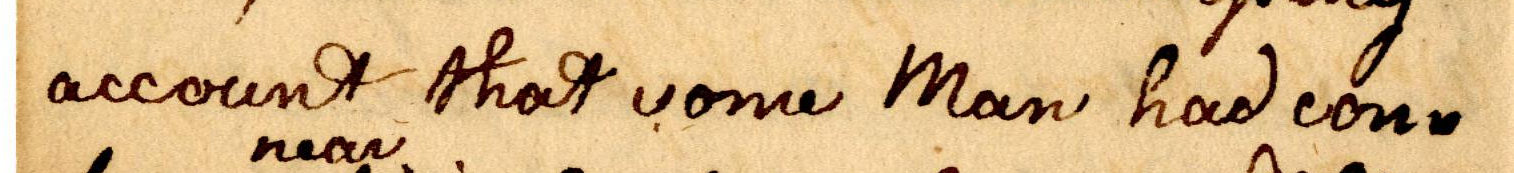account that some Man had come
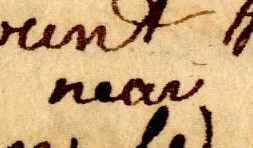near
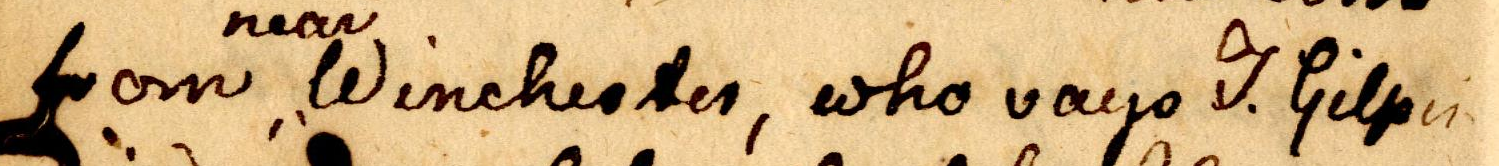from ^ Winchester, who says T. Gilpin
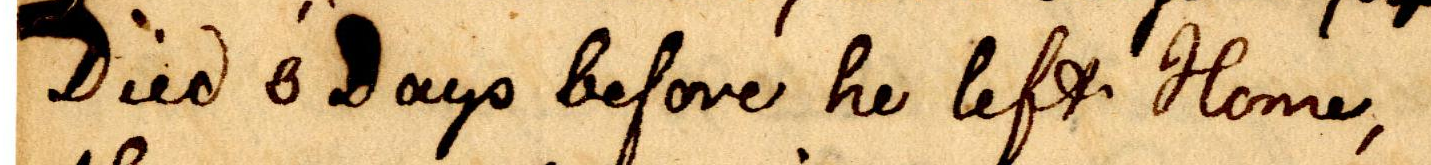Died 3 Days before he left Home,
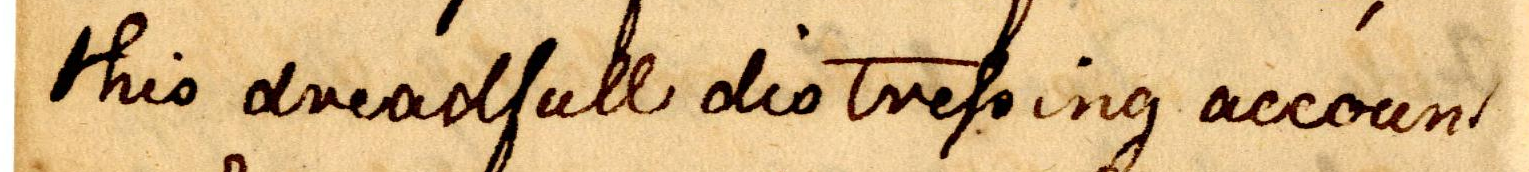this dreadfull distressing account
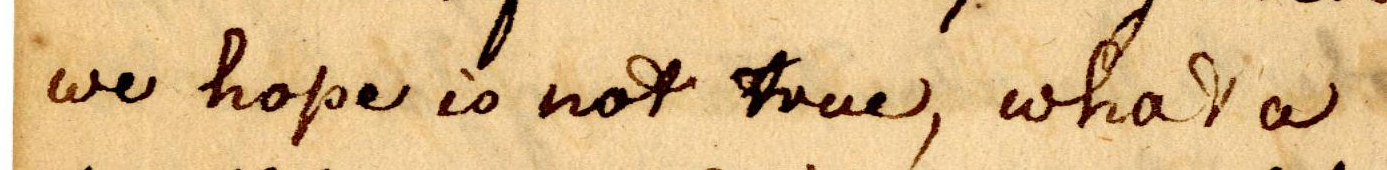we hope is not true, what a
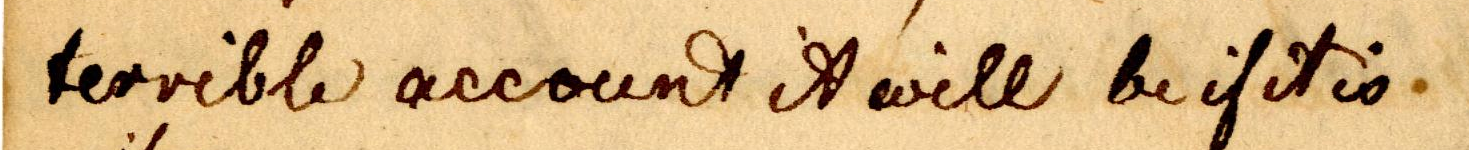terrible account it will be if it is.
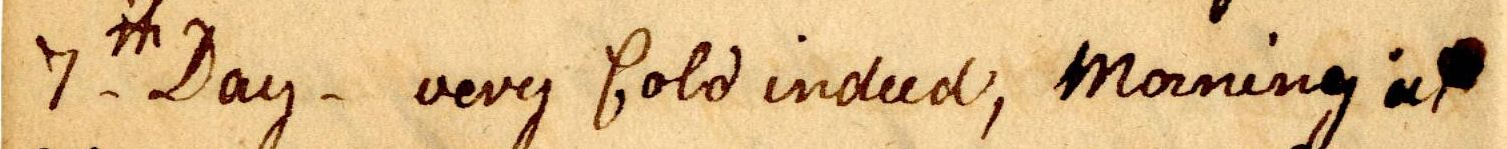7^th Day- very Cold indeed, Morning at
